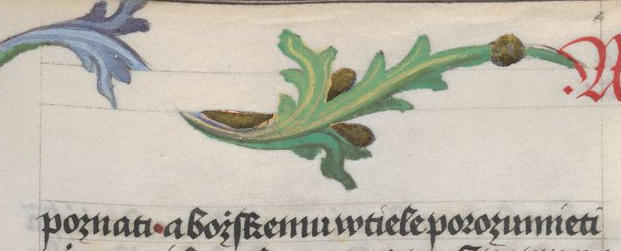poznati.bożſkemu w tiele pozozumieti
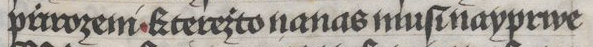pṙirozeni.ktereżto na nas muſi nayprwe
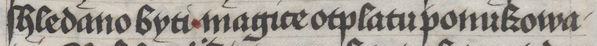hledano byti.magíce otplatu porukowa¬
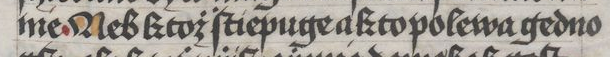me.Neb ktoż ẛtiepuge a kto polewa gedno
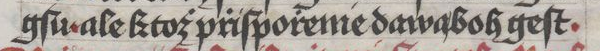gſu.ale ktoż pṙiſpoṙenie dawa boh geſt.
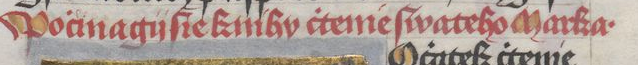Poċinagij ſie knihy ċtenie
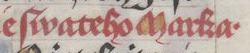ſwateho Marka.
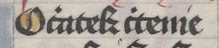Poċatek ċteme
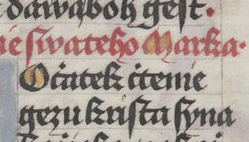gezu kriſta ſyna
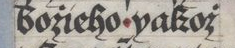bożíeho.yakoż
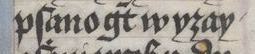pſano ḡt w yzay¬
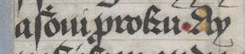a ẛowi ꝓroku.Ay
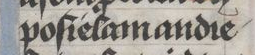poſielam andie¬
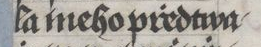la meho pṙed twa¬
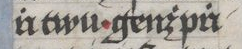ṙi twu.genż pṙi¬
